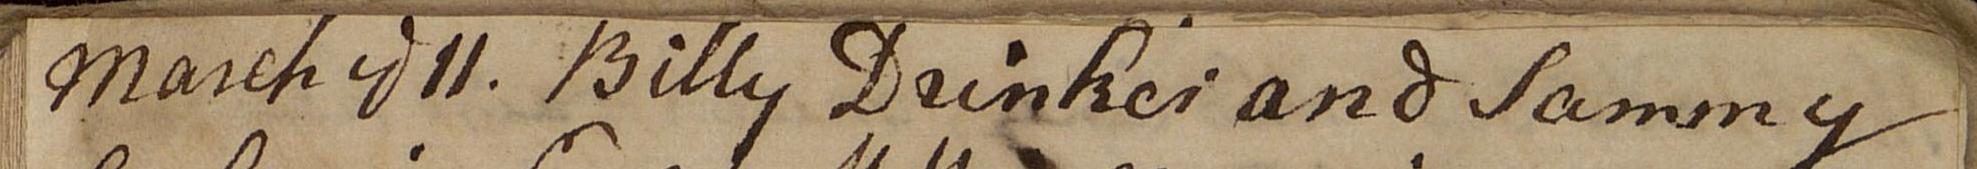March y^e 11. Billy Drinker and Sammy
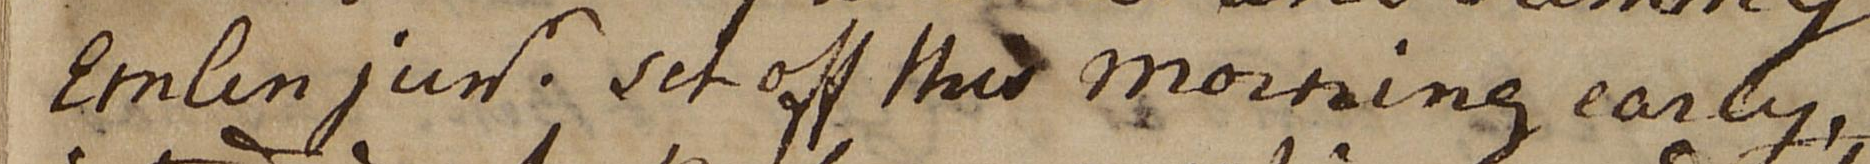Emlen jun^r. set of this morning early,
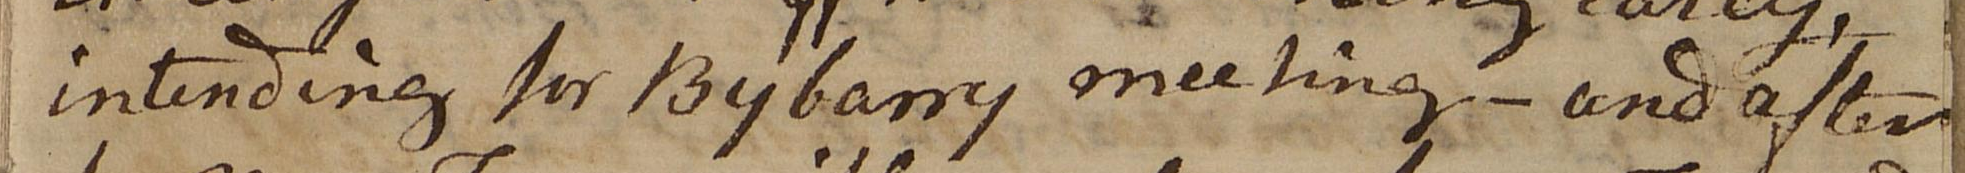intending for Bybarry meeting- and after
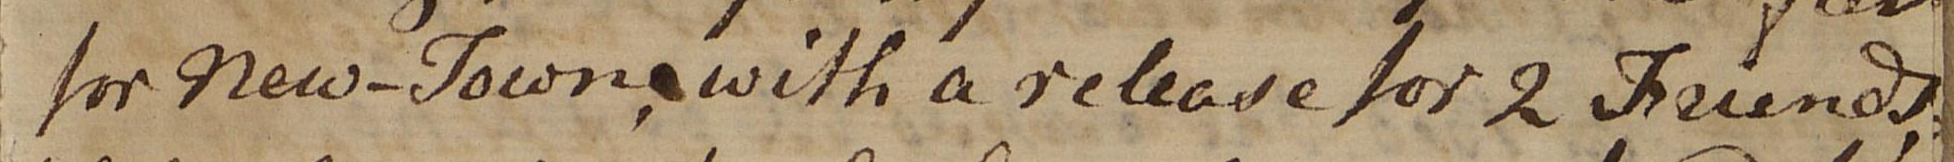for New-Town with a release for 2 Friends
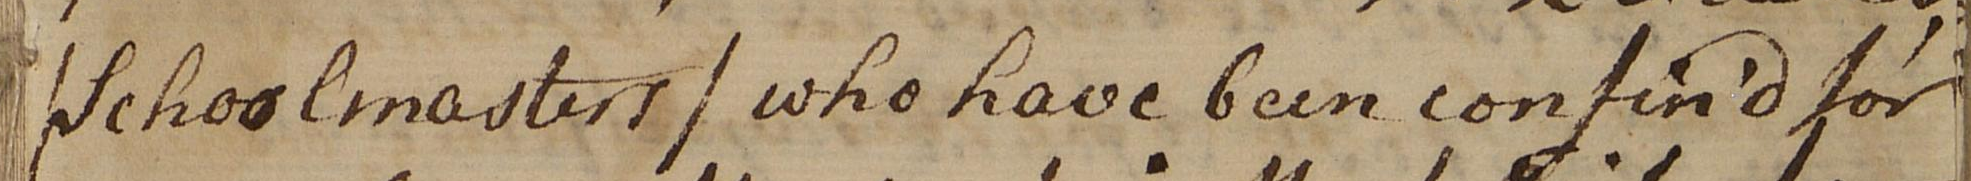/Schoolmasters/ who have been confin'd for
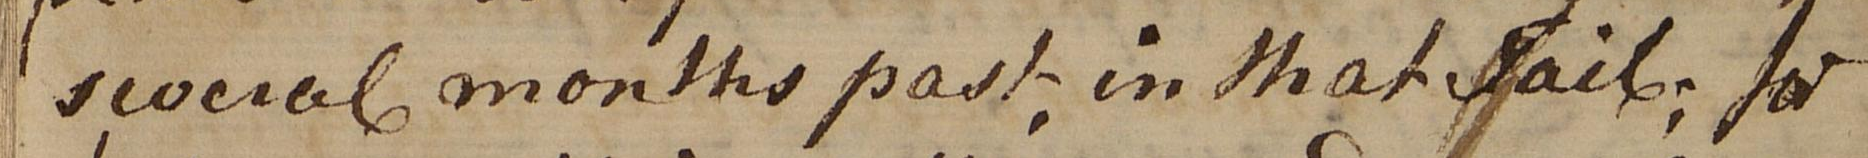several months past, in that Jail; for
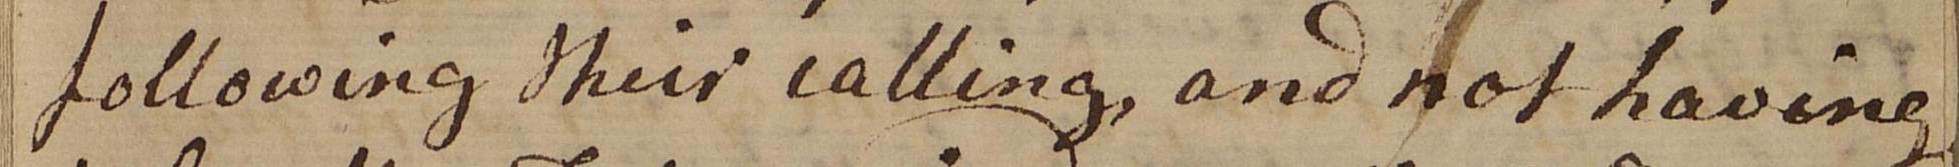following their calling, and not having
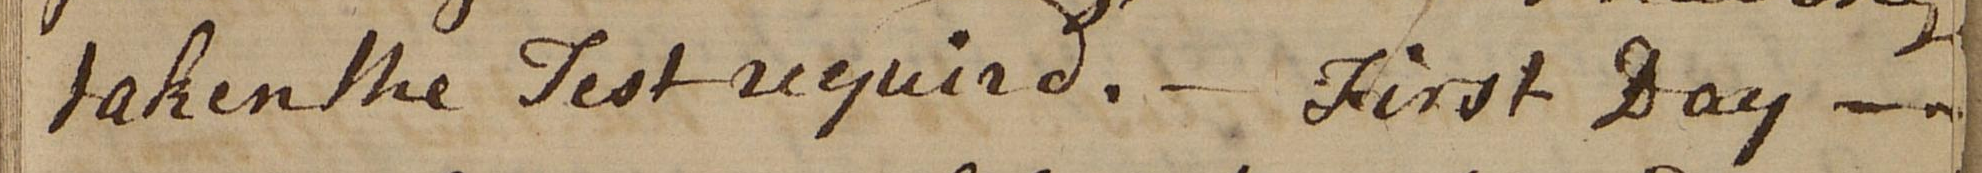taken the Test requird.- First Day-
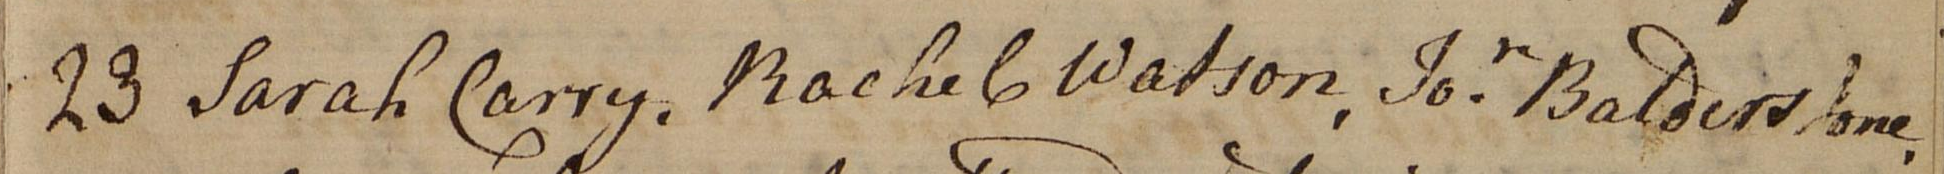23 Sarah Carry, Rachel Watson, Jo^r. Balderstone,
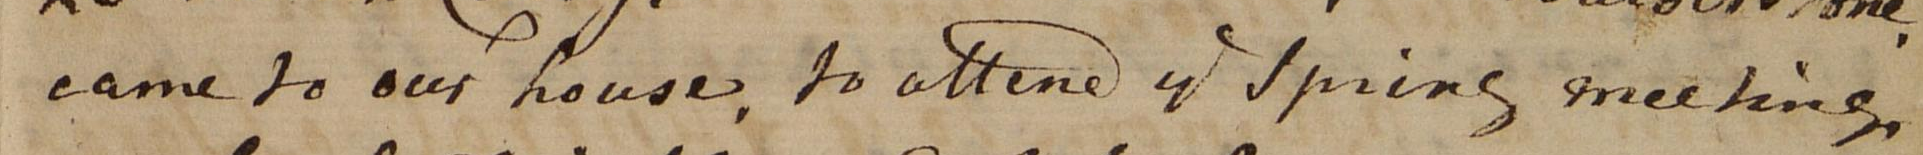came to our house to attend y^e Spring meeting
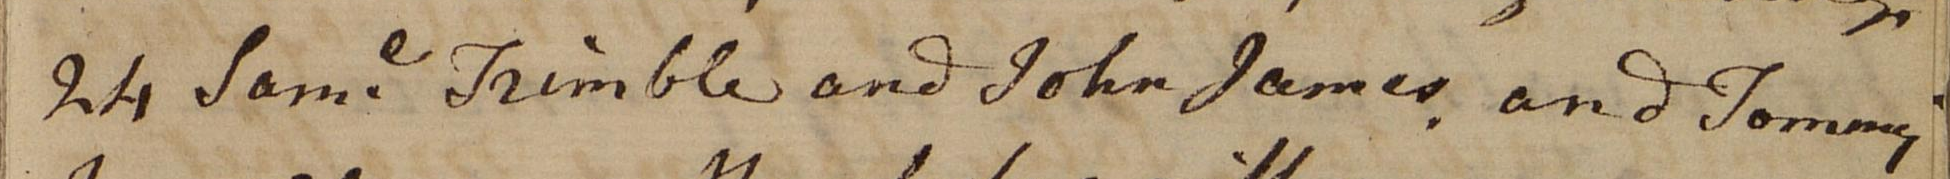24 Sam^l Trimble and John James, and Tommy
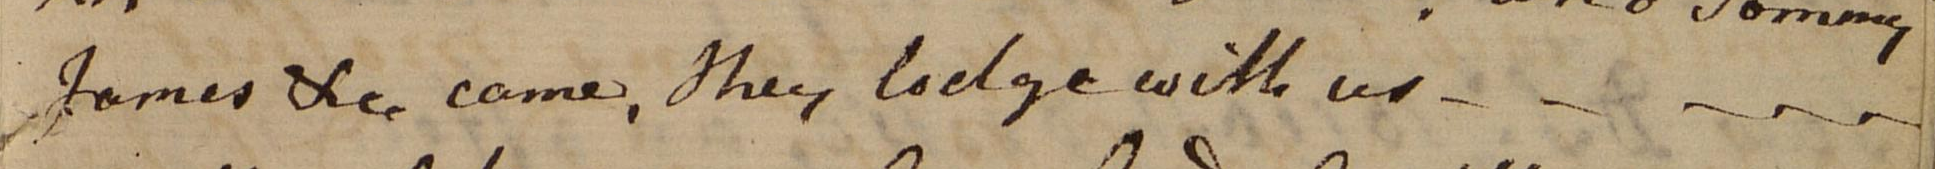James &c came, they lodge with us---
